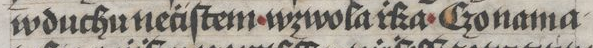wduchu neċiſtem wzwola ṙka.Czo nam a
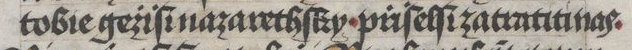tobie geżiẛi nazarethſky.pṙiẛelſi zatratiti nas.
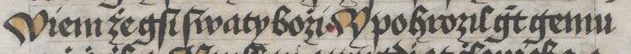Víem że gſi ſwaty bożí.Y pohrozil ḡt gemu
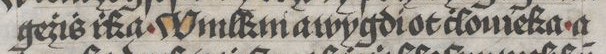geżíṡ ṙka.Vmlkni a wygdi ot ċlowieka.a
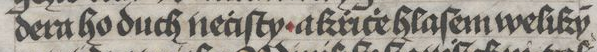dera ho duch neċiſty.a kriče hlaſem welikȳ
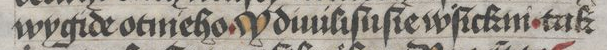wygide otieho.Y diuli ſu ſie wẛickni.tak
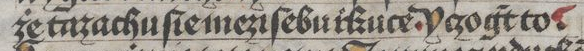że tazachu ſie mezí ſebu ṙkúce. czo ḡt to¬
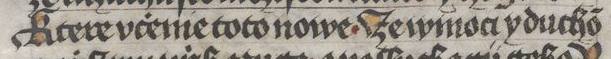Ktere vċenie toto nowe.Ze w moci y duchō
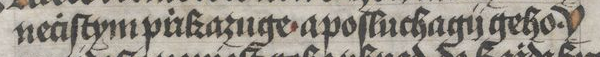neċiſtym pṙikazuge.a poſluchagí geho.Y
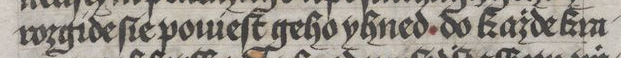rozgíde ſie powieſt geho yhned.do każde kra¬
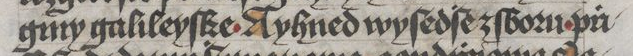giny galileyſke.A yhned wyſedẛe zſboru.pṙi¬
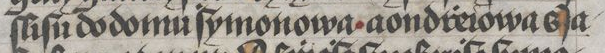ſliſu do domu ẛymonowa.a ondṙeiowa s Ia¬
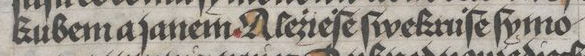kubem a Ianem.A leżíeẛe ſwekruẛe ſymo¬
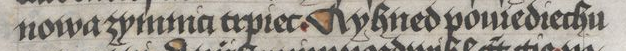nowa zimnici trpiec. A yhned povediechu
